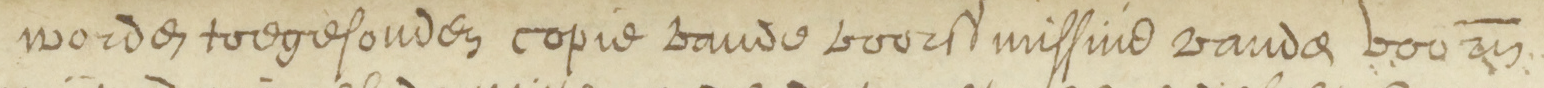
worden toegesonden copie vande voors missiuve vande voorn.
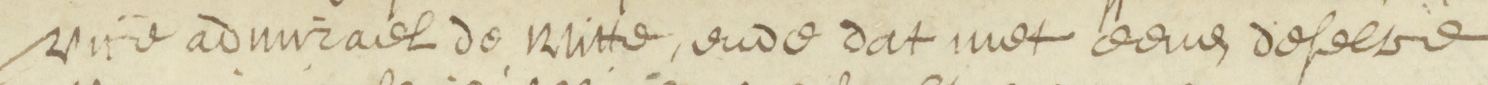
vice admirael de Witte, ende dat met eenen deselve
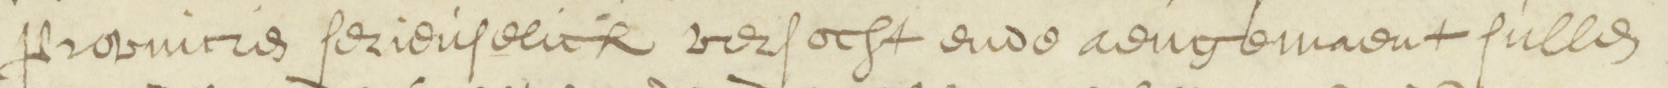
Provincien serieuselick versocht ende aengemaent sullen
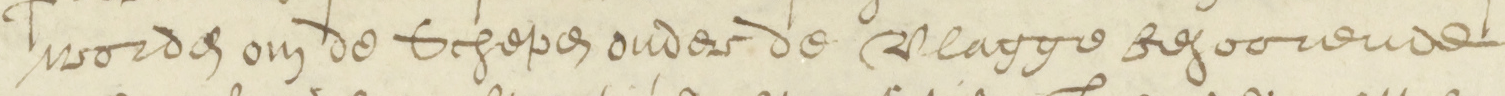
worden om de Schepen onder de Vlagge behoorende
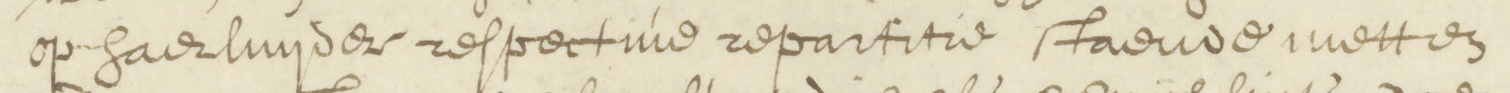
op haerluyder respectiue repartitie staende metten
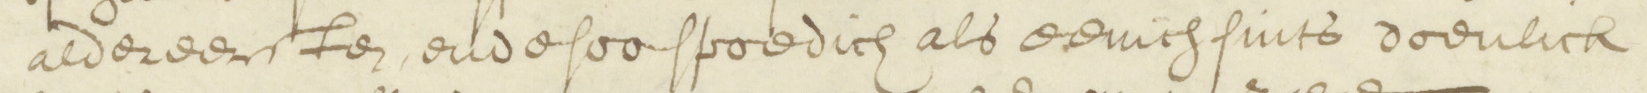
aldereersten, ende soo spoedich als eenichsints doenlick
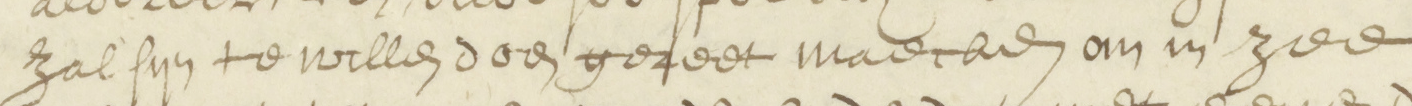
zal syn te willen doen gereet maecken om in zee
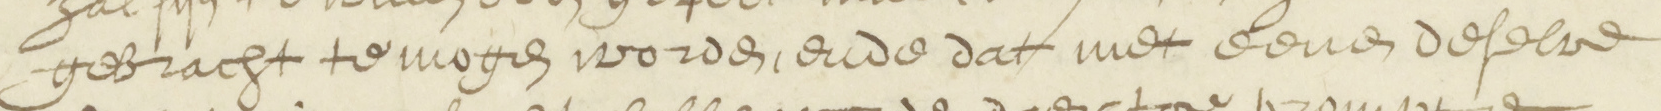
gebracht te mogen worden, ende dat met eenen deselve
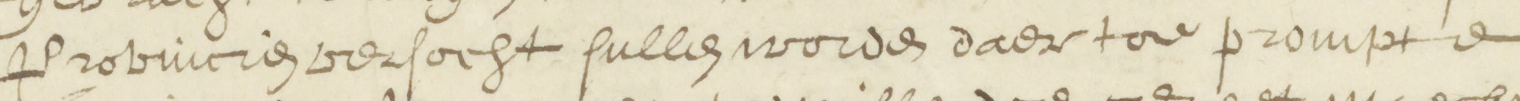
Provincien versocht sullen worden daer toe prompte
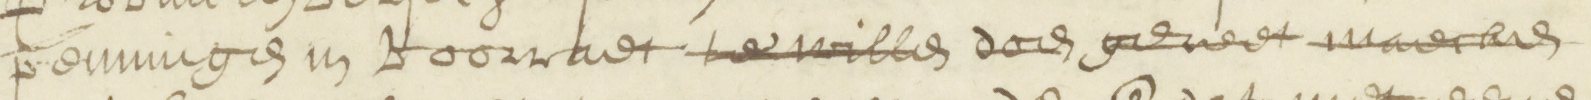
penningen in voorraet te willen doen gereet maecken
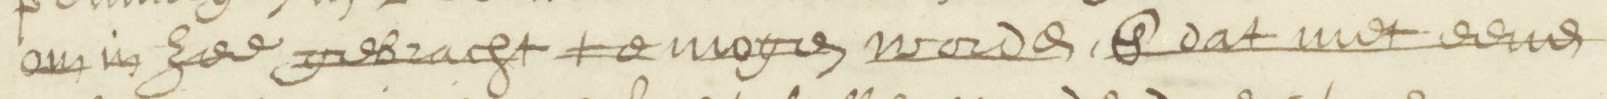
om in zee gebracht te mogen worden, & dat met eenen
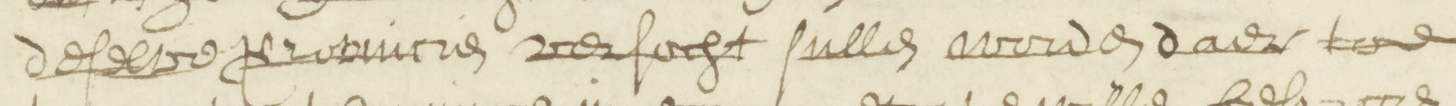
deselve Provincien versocht sullen worden daer toe
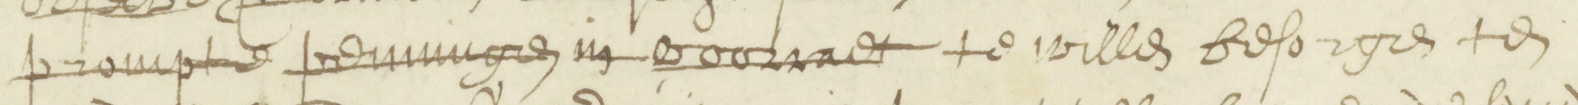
prompte penningen in voorraet te willen besorgen ten
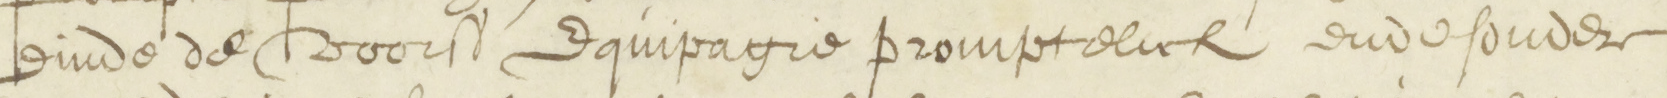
einde de voors Equipagie promptelick ende sonder
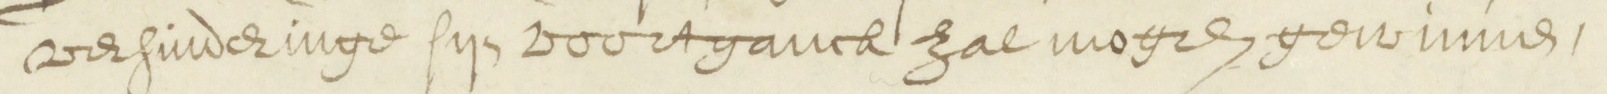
verhinderinge syn voortganck zal mogen gewinnen.
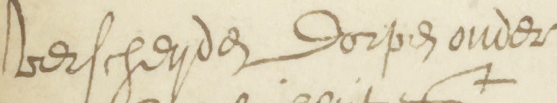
Verscheyden Dorpen onder
